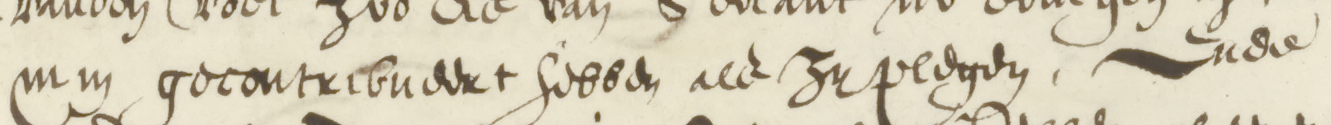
min gecontribueert hebben als zy plegen, ende
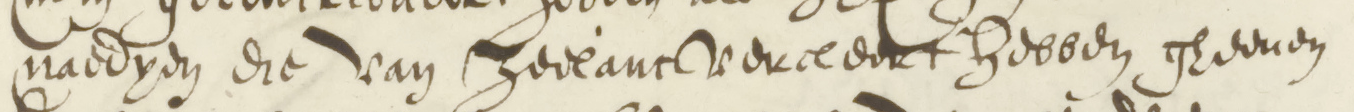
naedyen die van Zeelant vercleert hebben gheenen
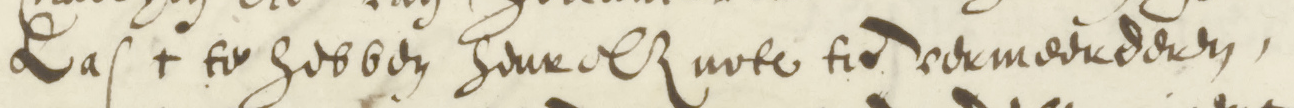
Last te hebben heur Quote te vermeerderen,
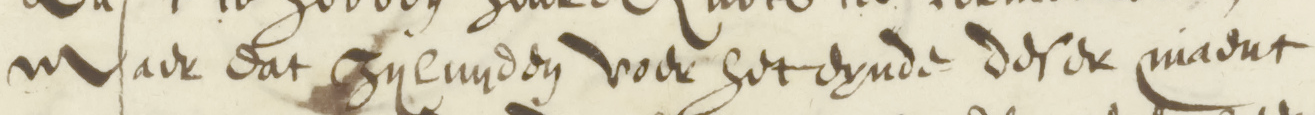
maer dat zijluyden voer het eynde deser maent
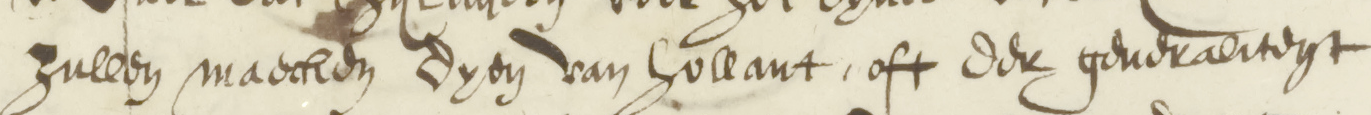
zullen maecken dyen van Holland, oft der generaliteyt
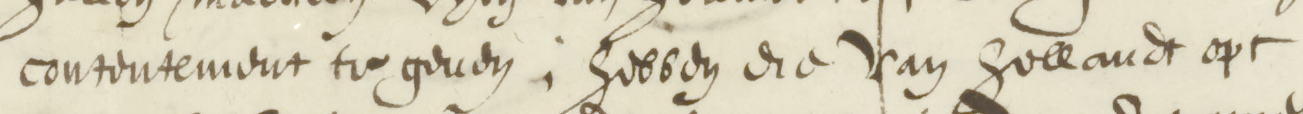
contentement te geven; hebben die van Hollant opt
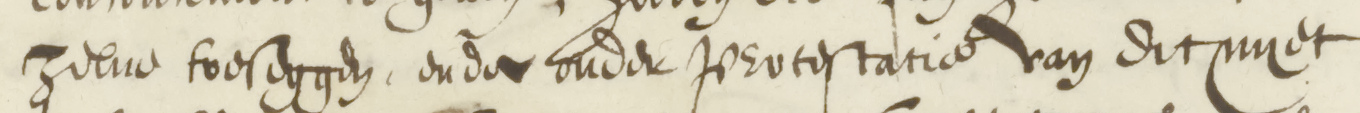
zelve toeseggen, ende onder protestatie van dit nyet
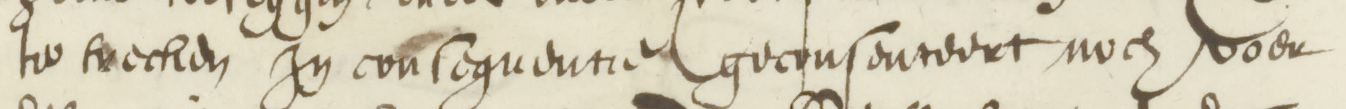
te trecken In consequentie geconsenteert noch voer
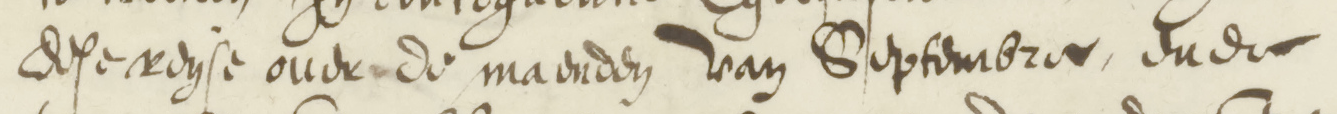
dese reyse ouer de maenden van Septembre ende
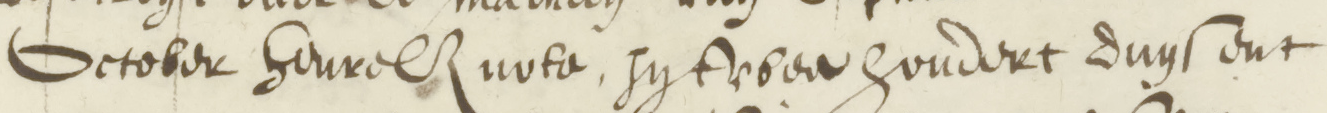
October heur Quote in twee hondert duysent
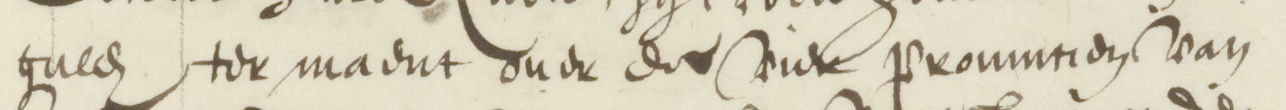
gulen ter maent over de vier prouintien van
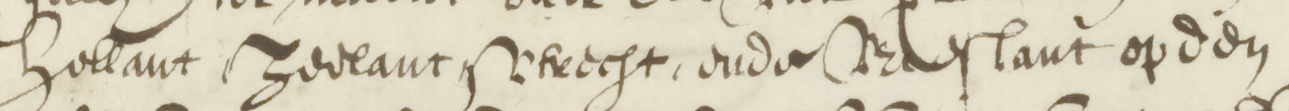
Hollant, Zeelant, Utrecht ende Vrieslant opden
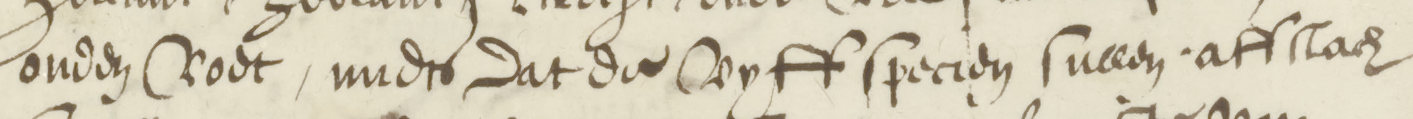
ouden voet, midts dat de vyff specien sullen affslach
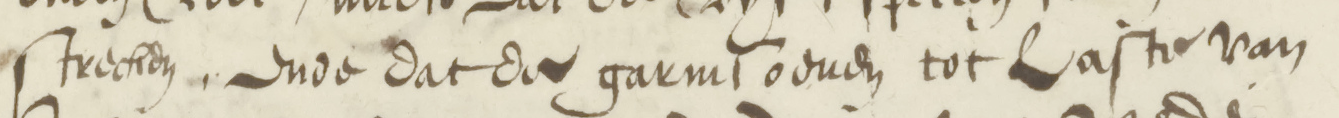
strecken, ende dat de garnisoenen tot laste van
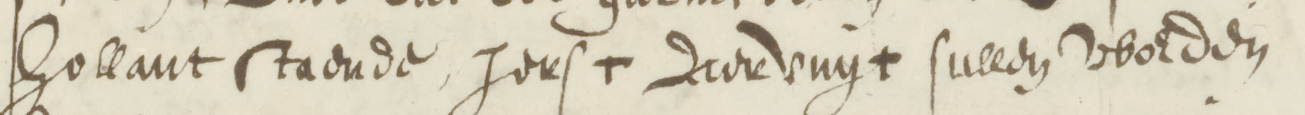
hollant staende Ierst daervuijt sullen worden
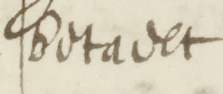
betaelt.
